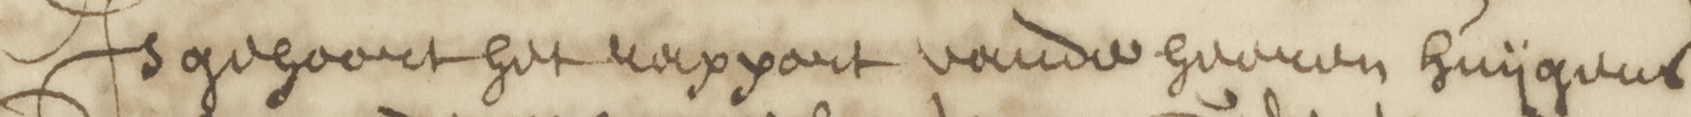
Is gehoort het rapport vande heeren huijgens
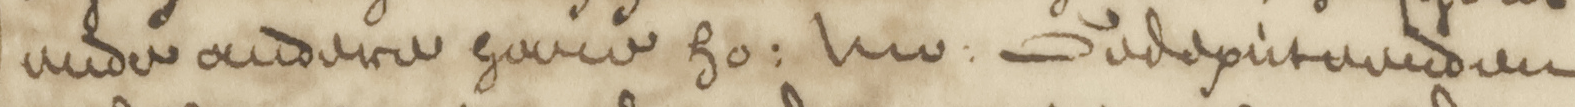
ende andere hare ho:Mo: Gedeputeerden
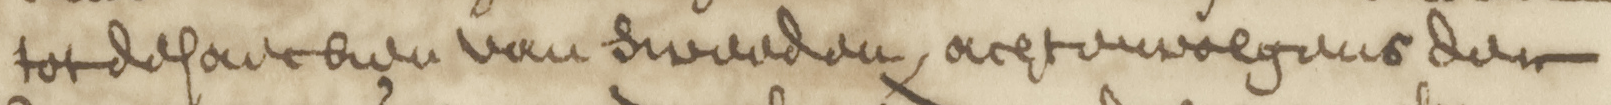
tot de saecken van Sweeden, achtervolgens der
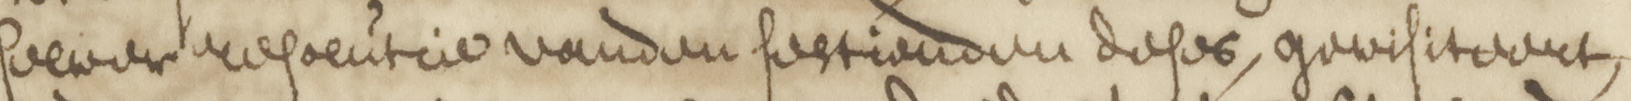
selver resolutie vanden sestienden deses, gevisiteert
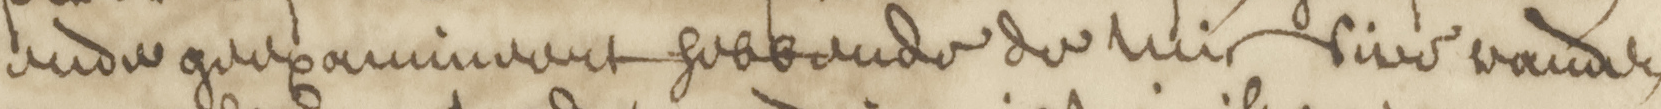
ende geexamineert hebbende de Missive vande
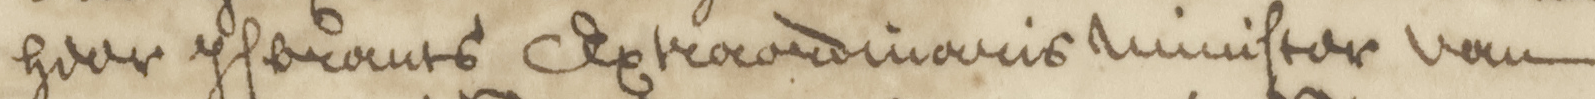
heer Isbrants Extraordinaris Minister van
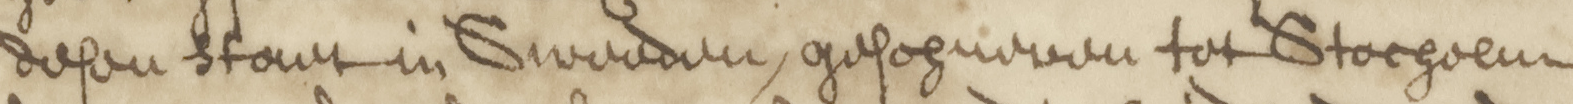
desen Staet in Sweeden, geschreven tot Stocholm
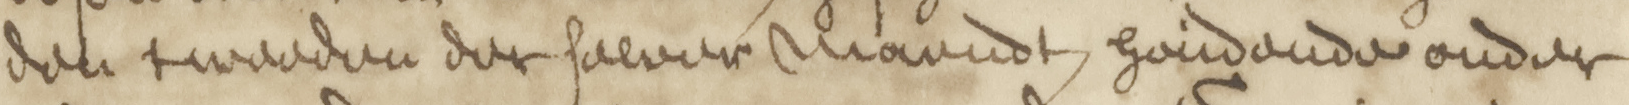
den tweeden der selver Maendt, houdende onder
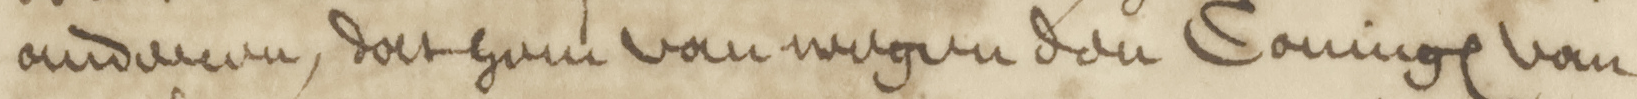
anderen, dat hem van wegen den Coningh van
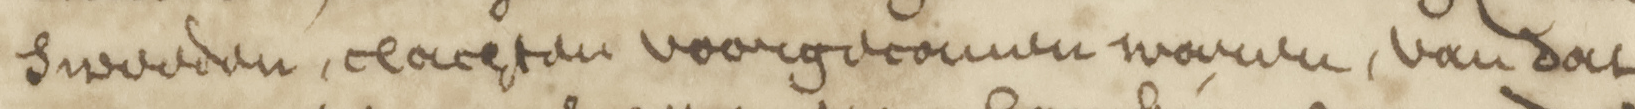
Sweeden, clachten voorgecomen waren, van dat
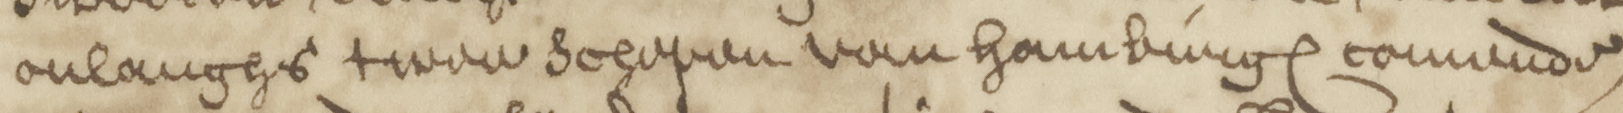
onlanghs twee schepen van Hamburgh comende
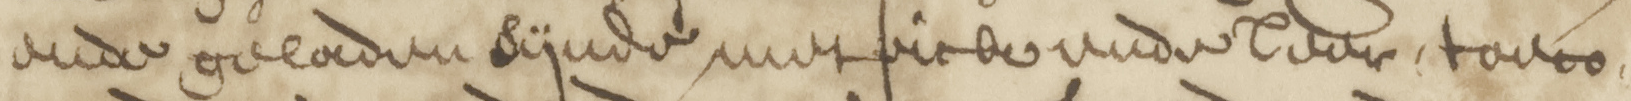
ende geladen sijnde, met pick ende Teer, toeco,,
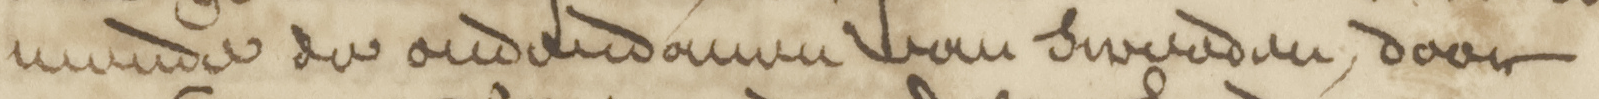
,,mende de onderdanen van Sweeden, door
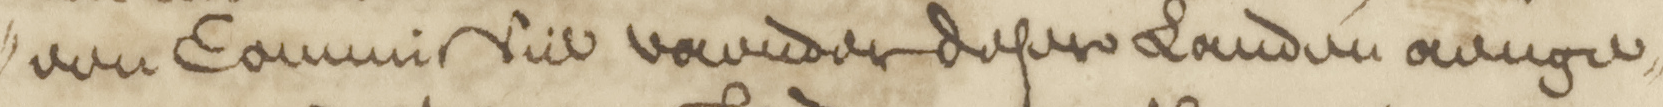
een Commissie vaerder deser Landen aenge„
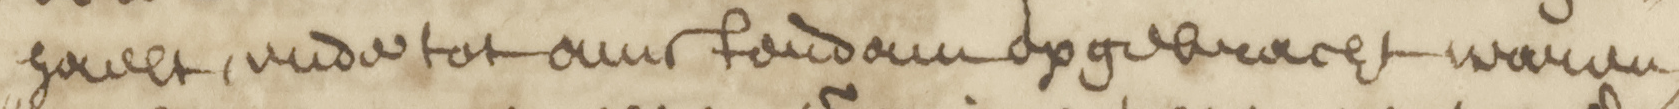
haelt, ende tot amsterdam opgebracht waren
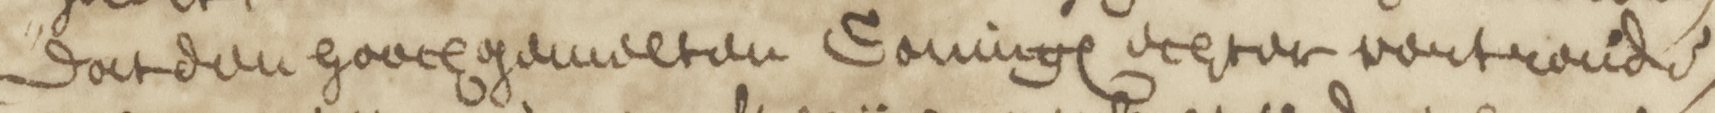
Dat den hoochgemelten Coningh echter vertroude
